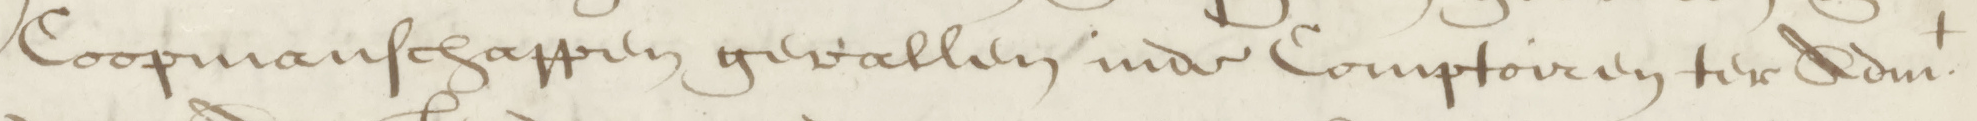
Coopmanschappen gevallen inde Comptoiren ter Admt.
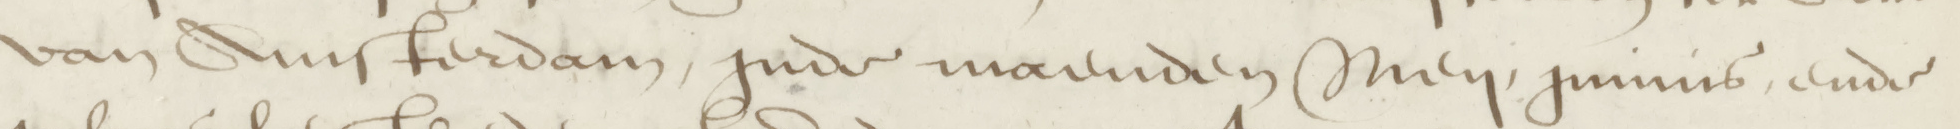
van Amsterdam, Inde maenden Mey, junius, ende
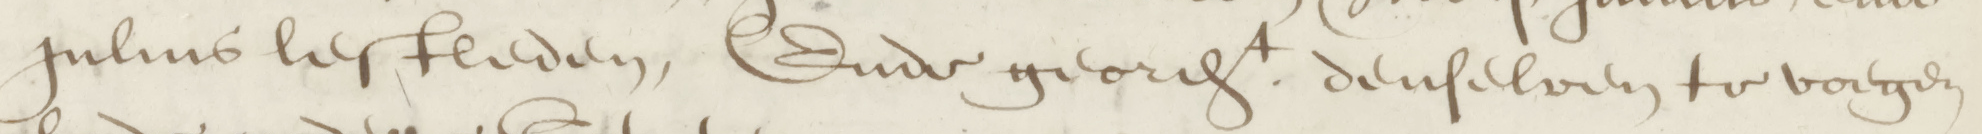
julius lestleden, Ende geordt. denselven te voegen
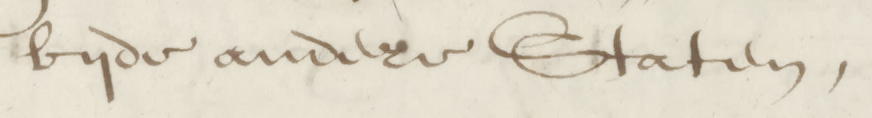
byde andere Staten.
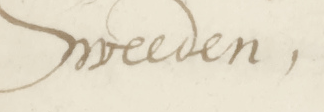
Sweeden.
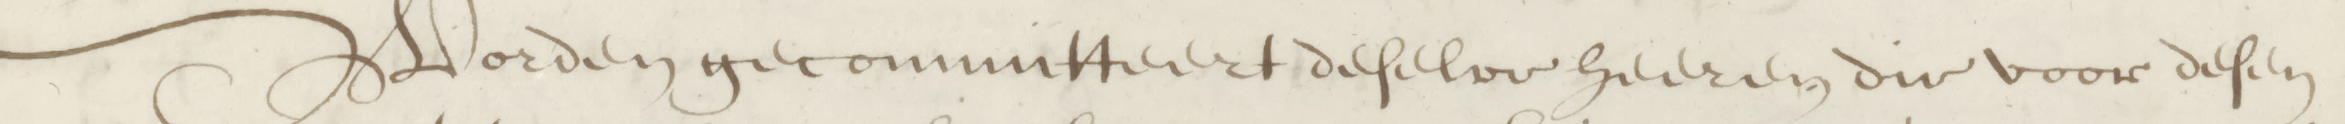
Worden gecommitteert deselve heeren die voor desen
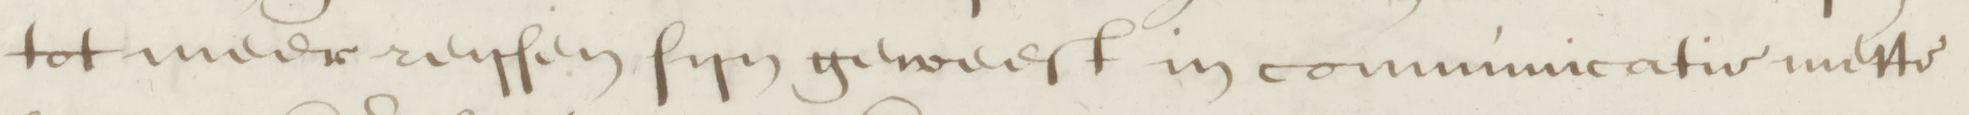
tot meer reysen syn geweest in communicatie mette
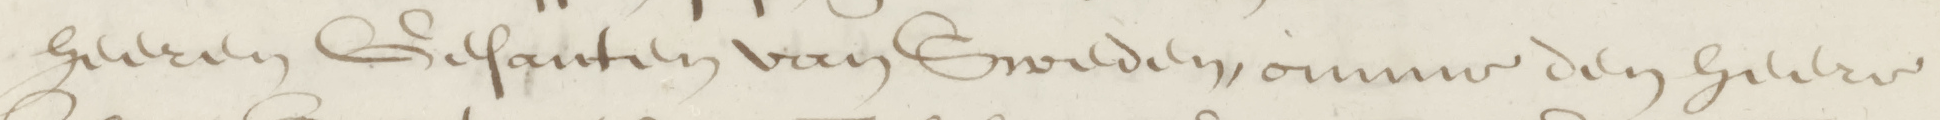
heeren Gesanten van Sweden, omme den heere
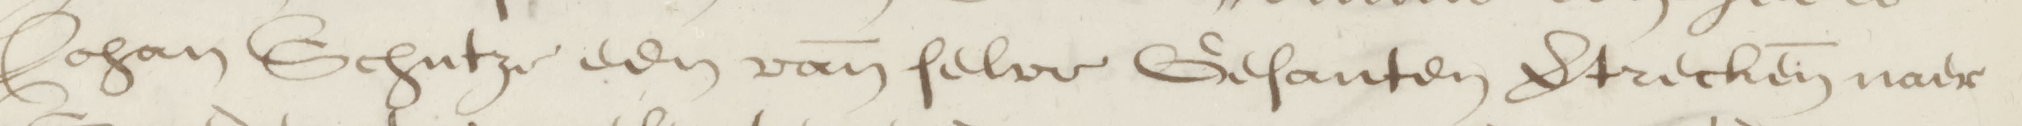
Johan Schutze een van selve Gesanten vtrecken naer
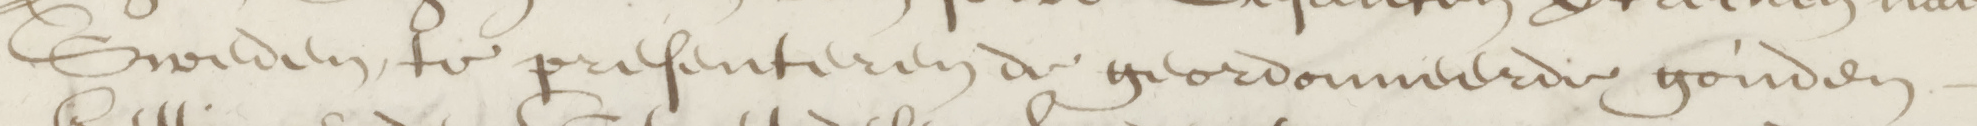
Sweden, te presenteren de geordonneerde gouden
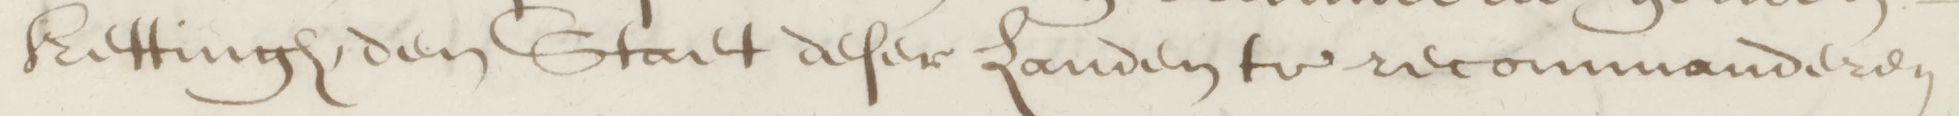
kettingh, den Staet deser Landen te recommanderen
